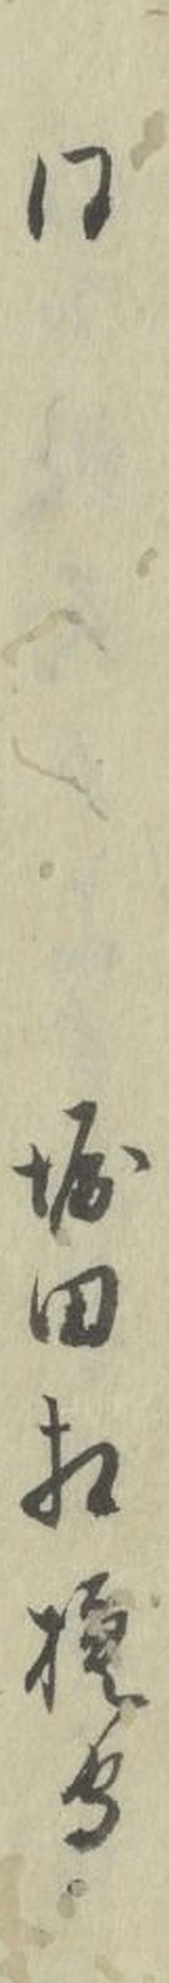同堀田相模守
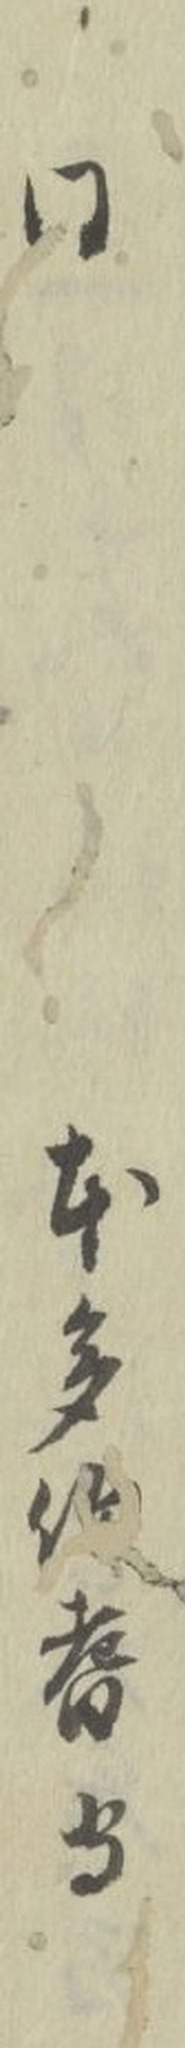同本多伯耆守
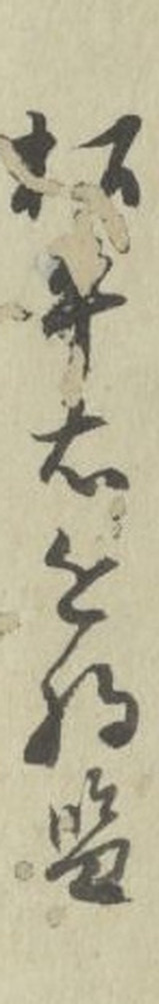同松平右近将監
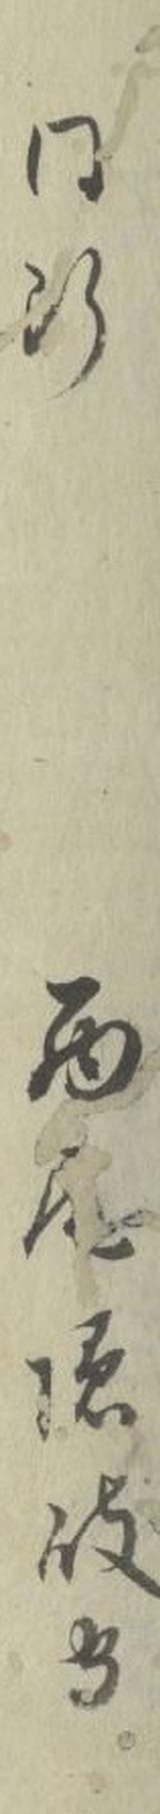同断西尾隠岐守
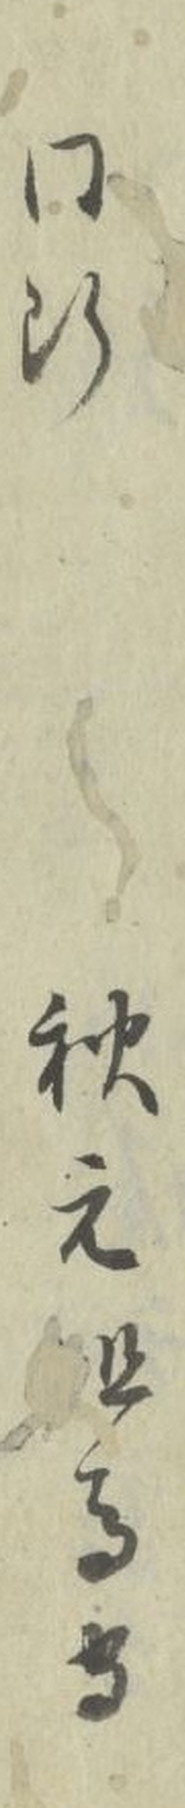同断秋元但馬守
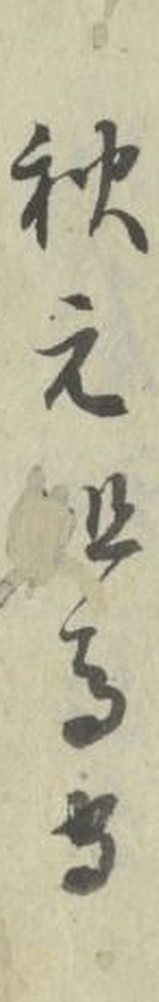同断秋元但馬守
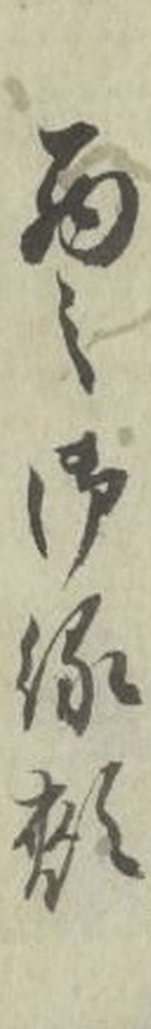西之御縁頬
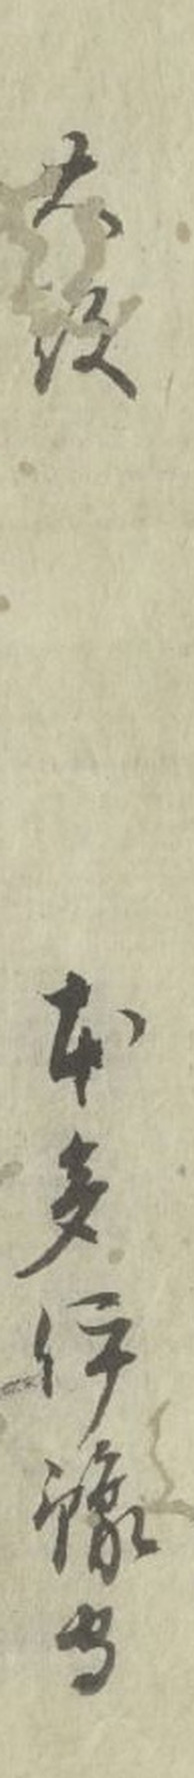大紋本多伊予守
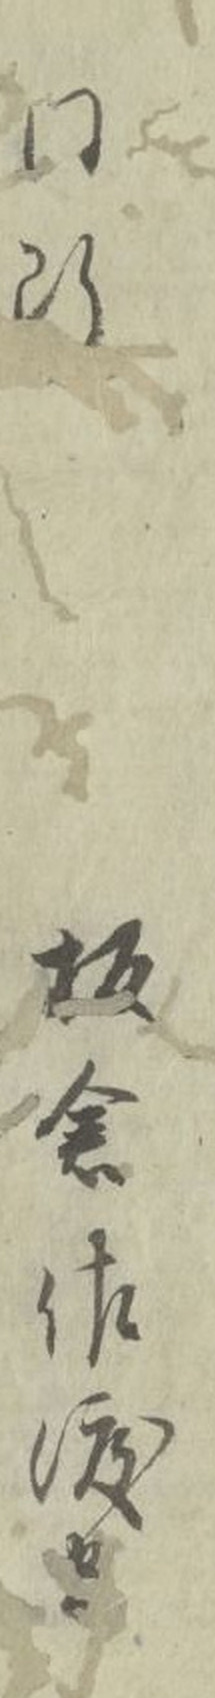同断板倉佐渡守

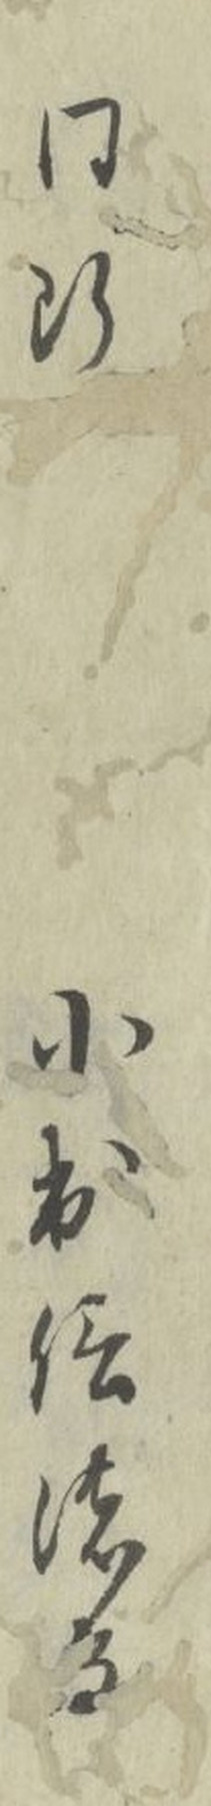同断小出信濃守
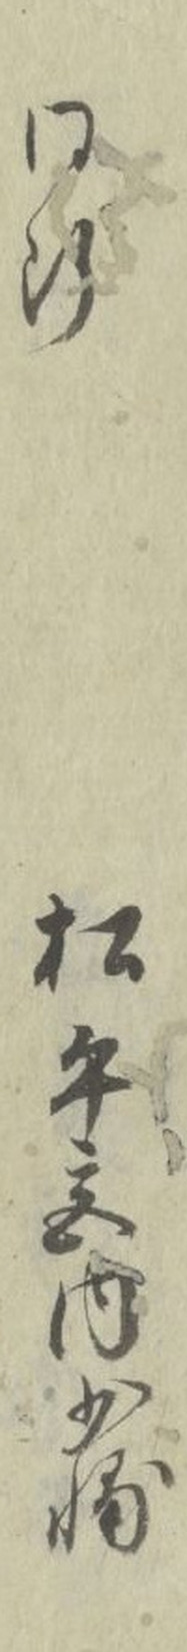同断松平宮内少将
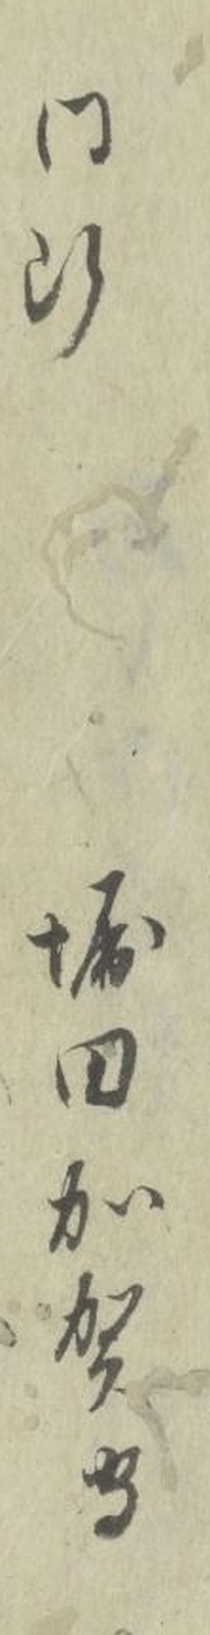同断堀田加賀守
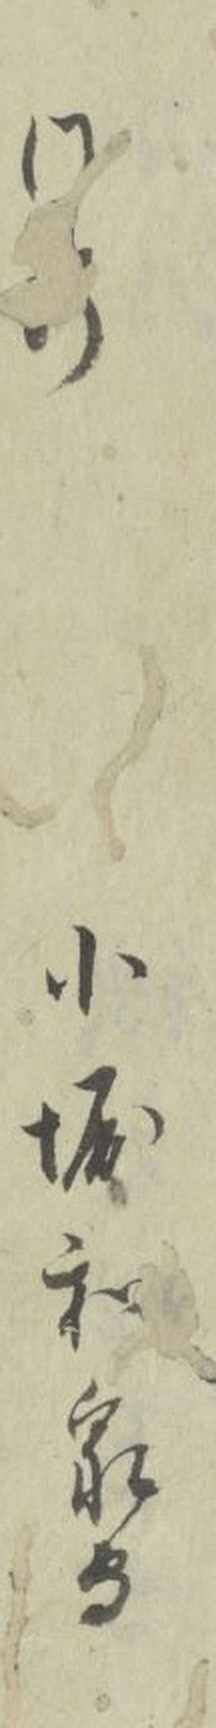同断小堀和泉守
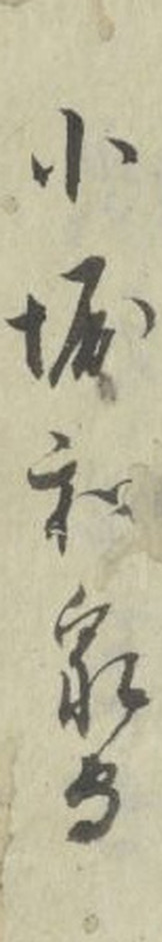同断小堀和泉守
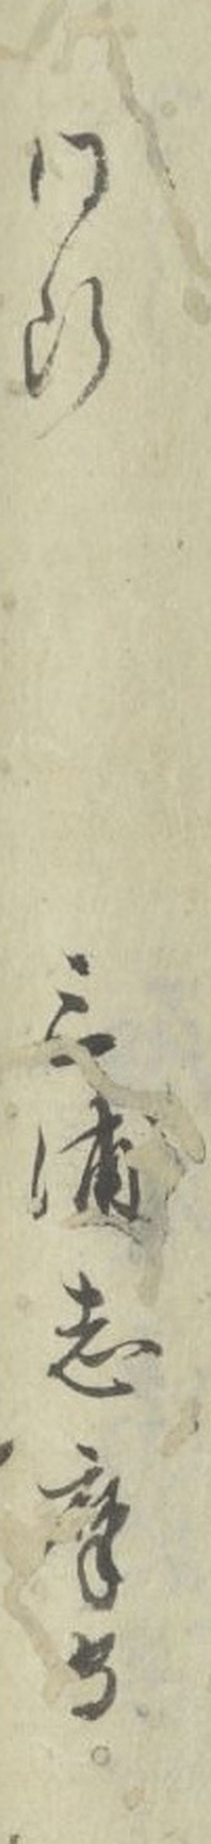同断三浦志摩守
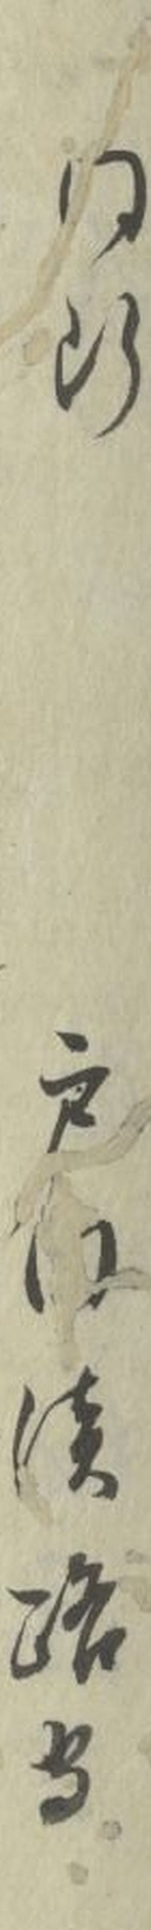同断戸田淡路守
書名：琉球来朝記 自一至七
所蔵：University of the Ryukyus Library
